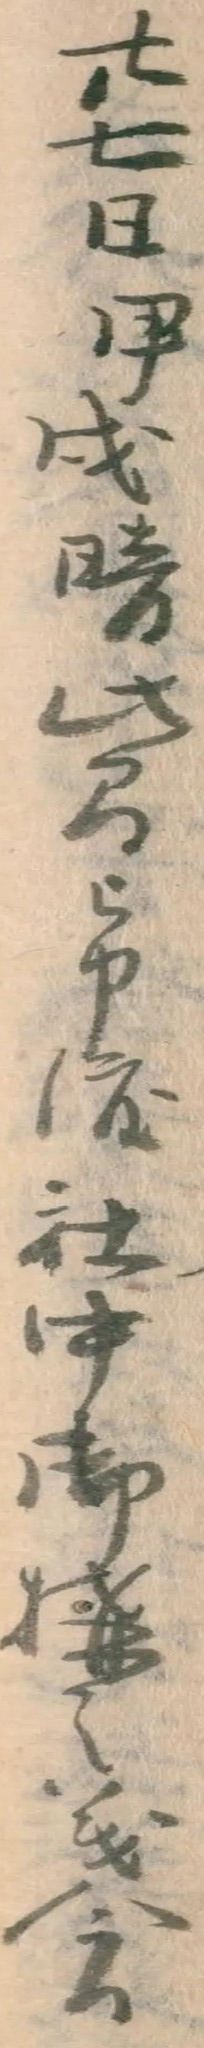廿七日甲戌晴、此間被申渡社中御構之義、今日
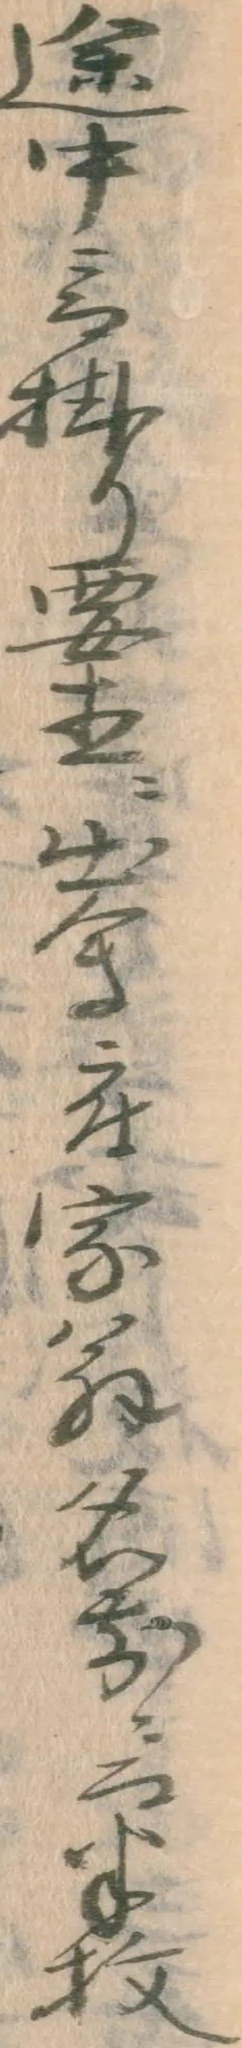途中に而掛り、要直に出會ニ付家翁名前ニ而半枚
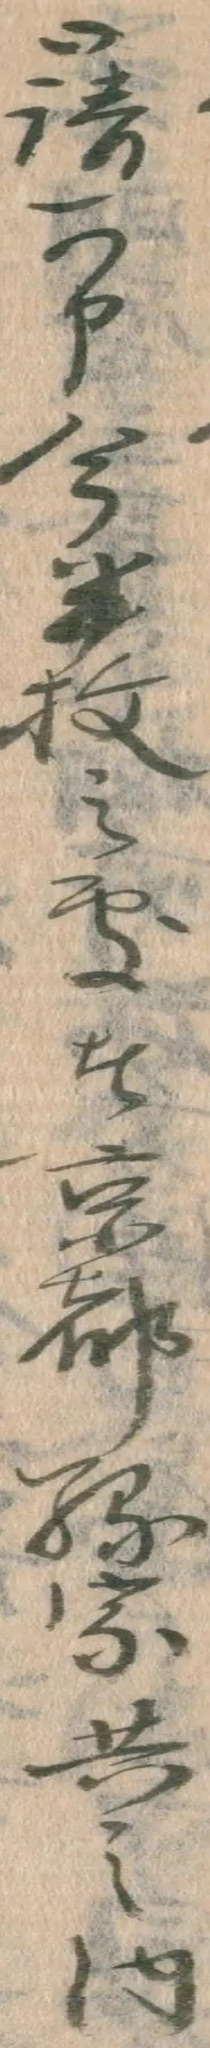御請可申、今半枚之處者、京都縁家共之内
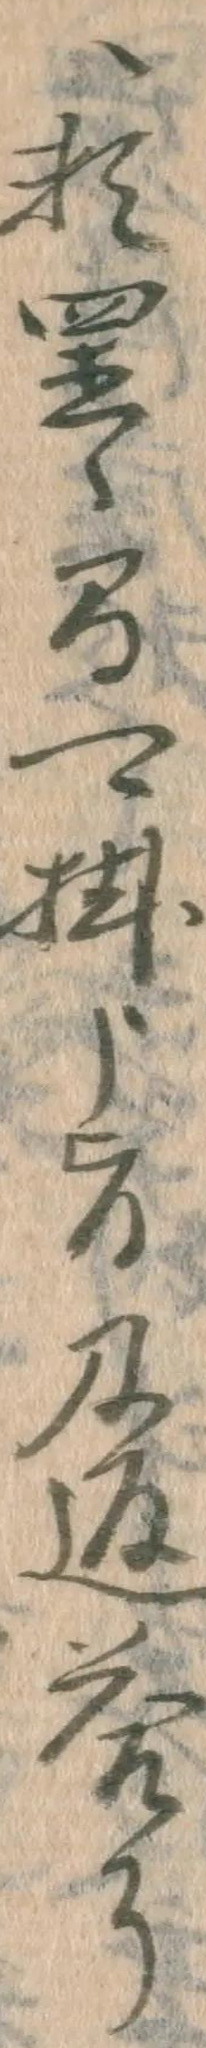へ頼置候間、可掛申旨及返答了、
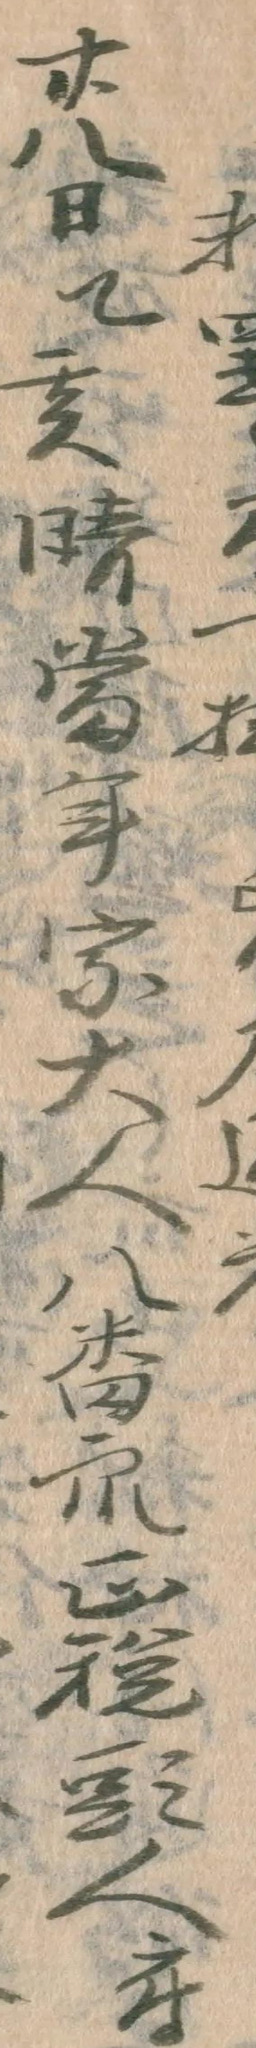廿八日乙亥晴、當年家大人八番衆正税頭人ニ付
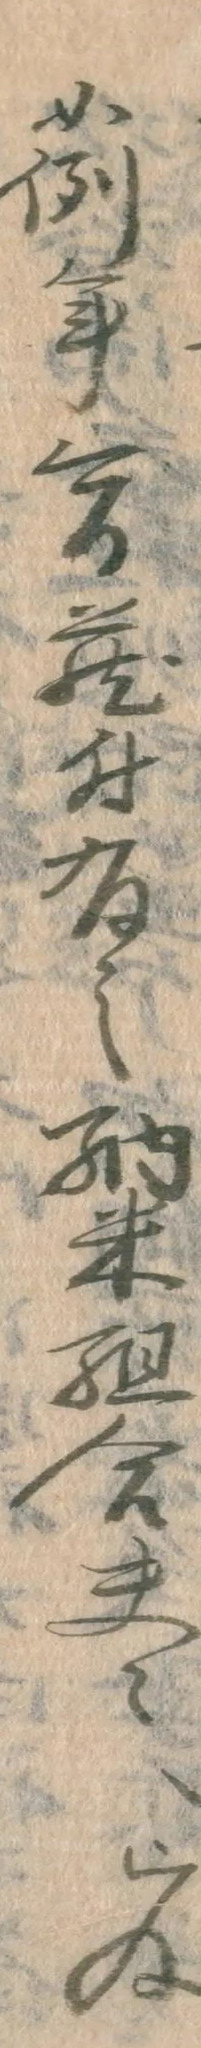如例年今日蔵付有之、納米組合夫々へ被為
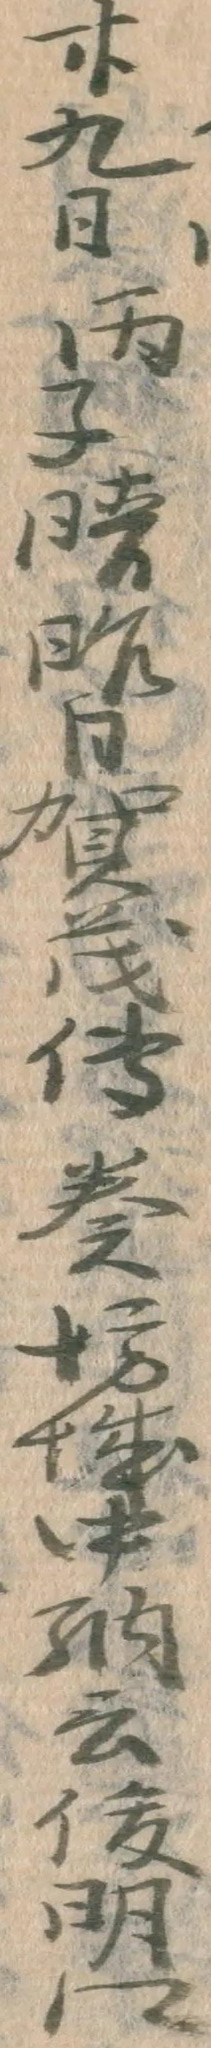廿九日丙子晴、昨日賀茂傳奏坊城中納言俊明卿
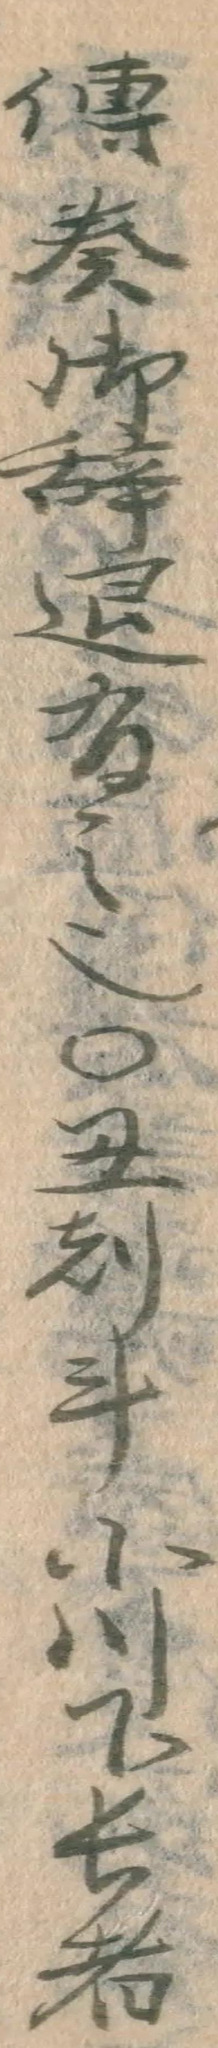傳奏御辞退有之也、○丑刻斗小川下長者
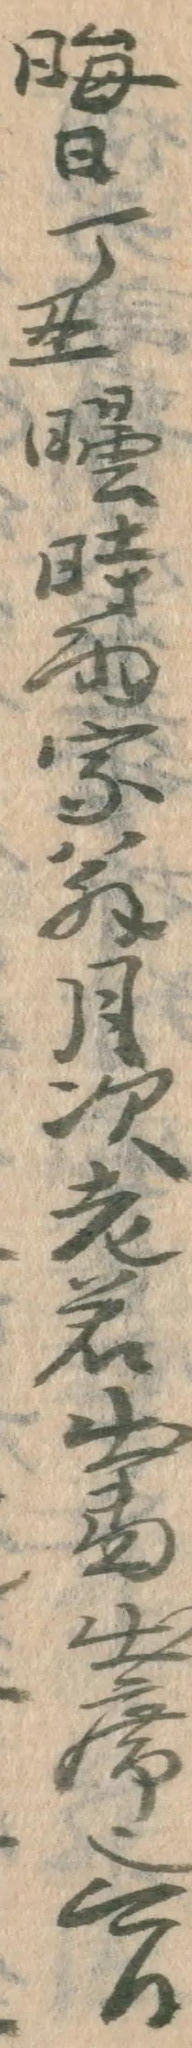晦日丁丑曇時雨、家翁月次老若出番出席也、今日
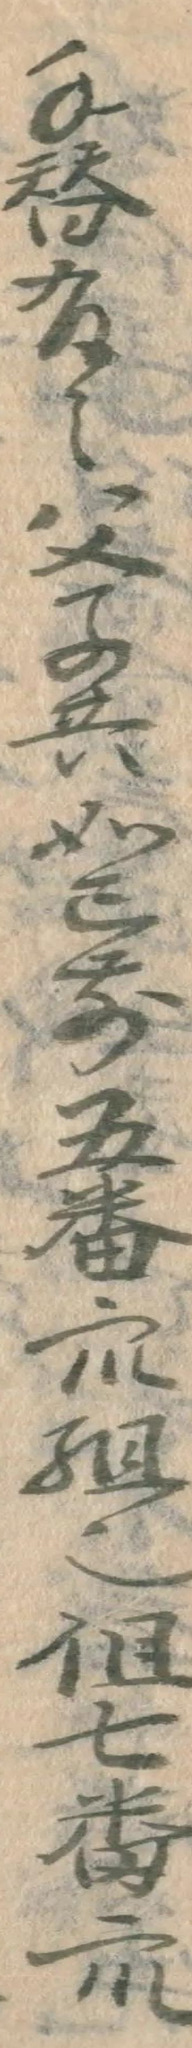手替有之、父子共如已前五番衆組也、但七番衆
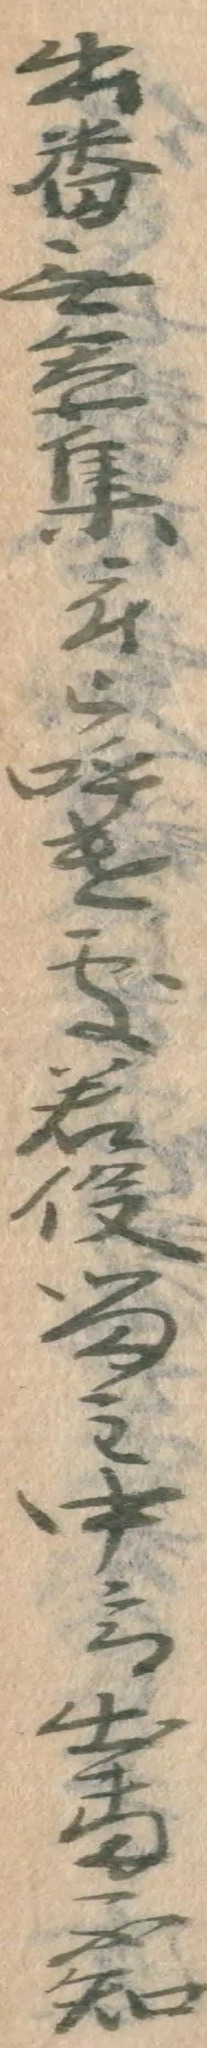出番無参集ニ付、被呼遣處、若役留守中ニ而出番不知

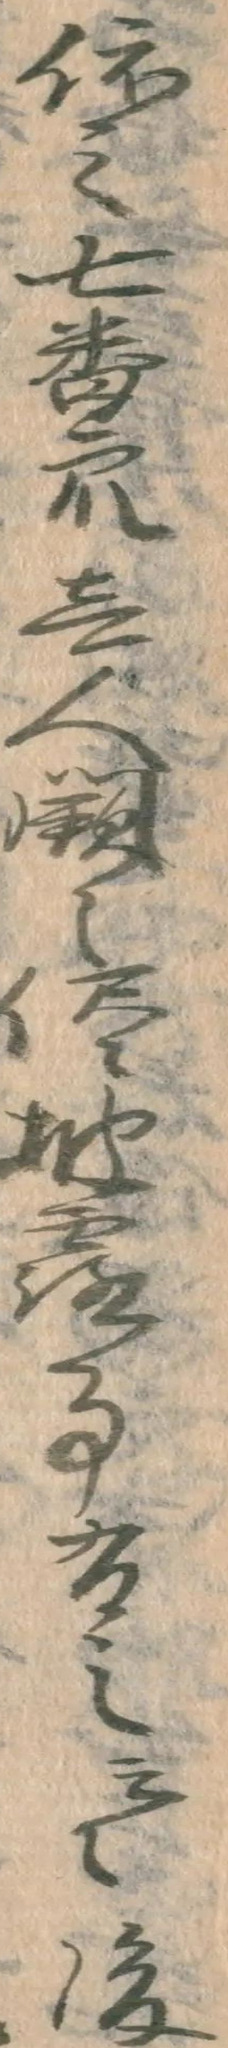依之七番衆壱人闕之侭披露事有之云〻、後
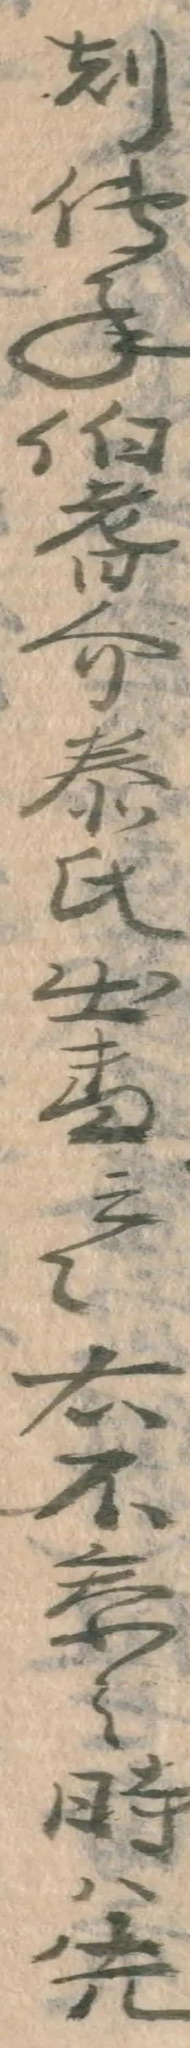刻傳承伯耆介泰氏出番云〻、右不参之時ハ先
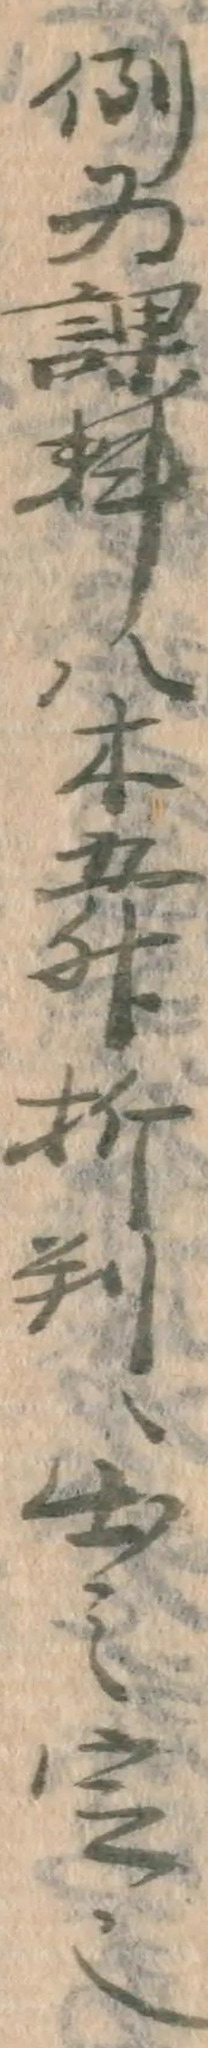例為課科八木五升折判へ出之定也、
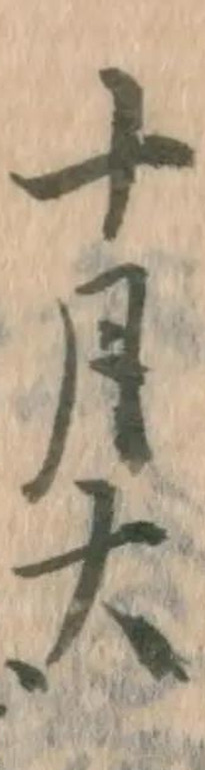十月大
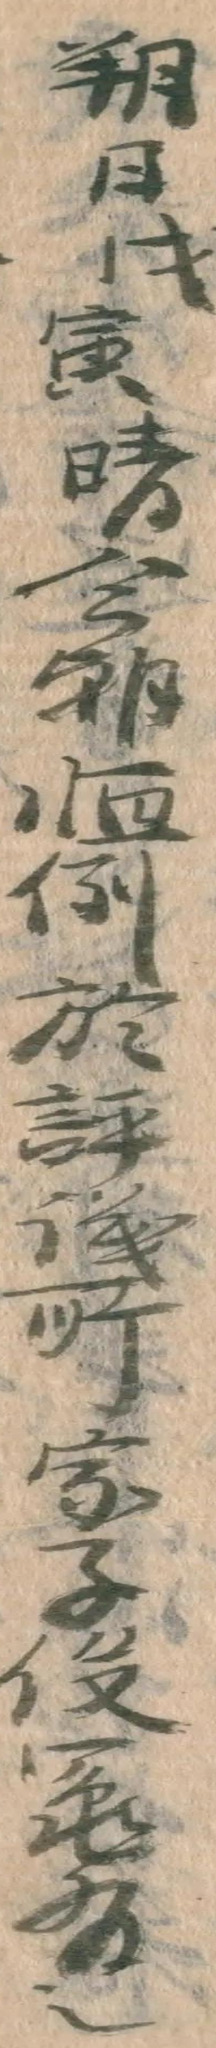朔日戊寅晴、今朝恒例於評議所家子鬮罪有之、
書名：賀茂社記録. 第63冊
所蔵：国立国会図書館 National Diet Library, JAPAN
